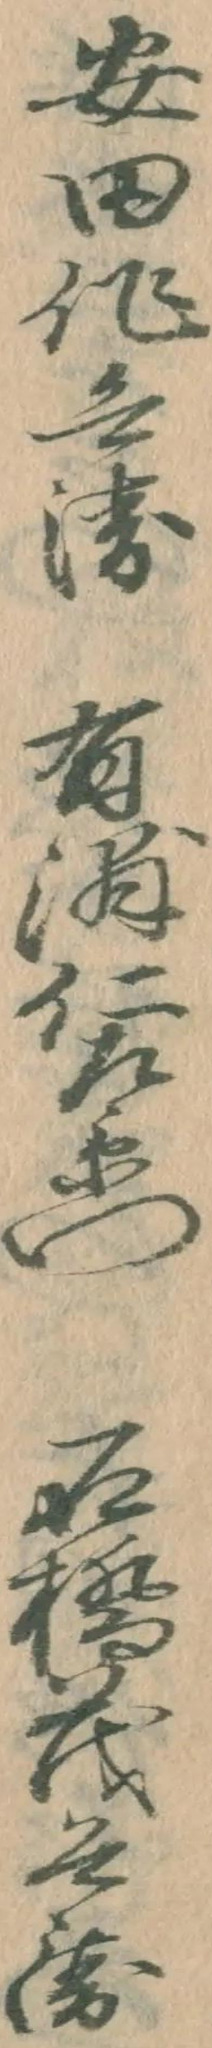安田作兵衛有浦仁左衛門石橋茂兵衛

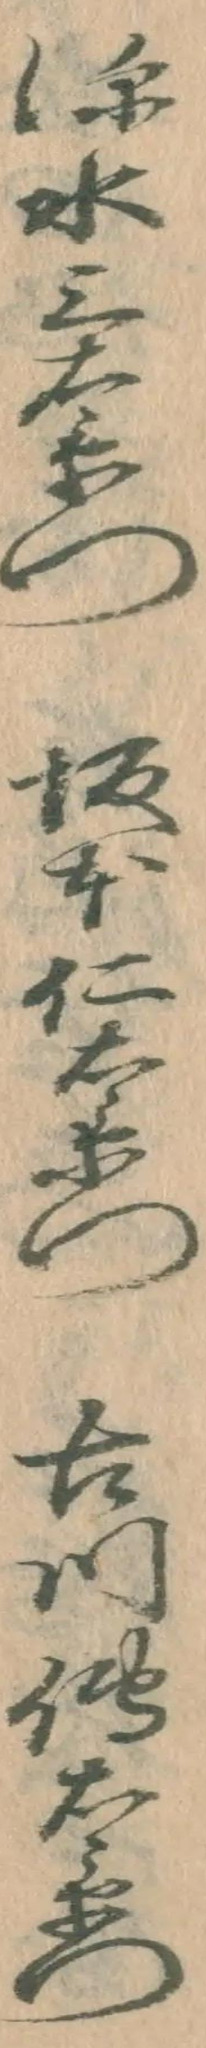深水三右衛門坂本仁右衛門古川伝右衛門
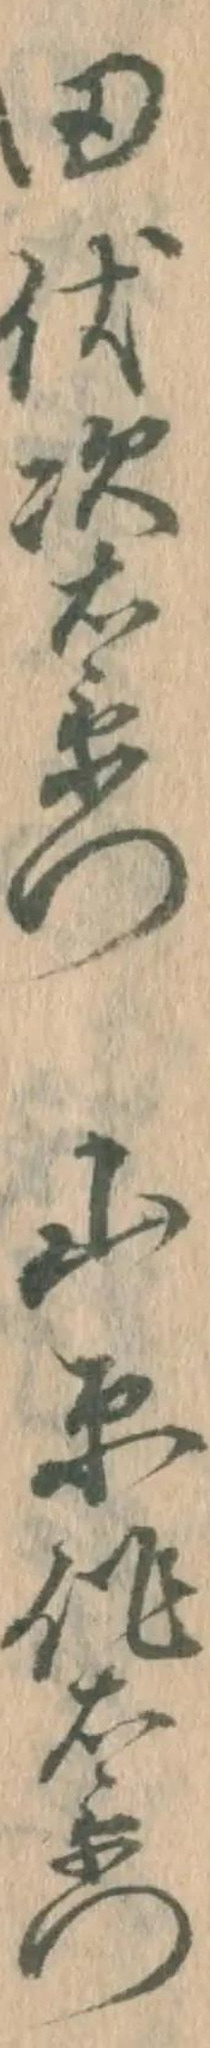田伏次右衛門山原作右衛門
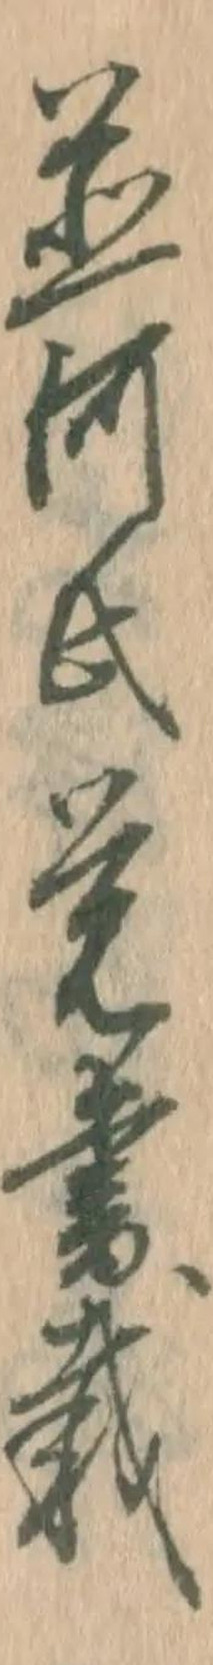並河氏覚書載
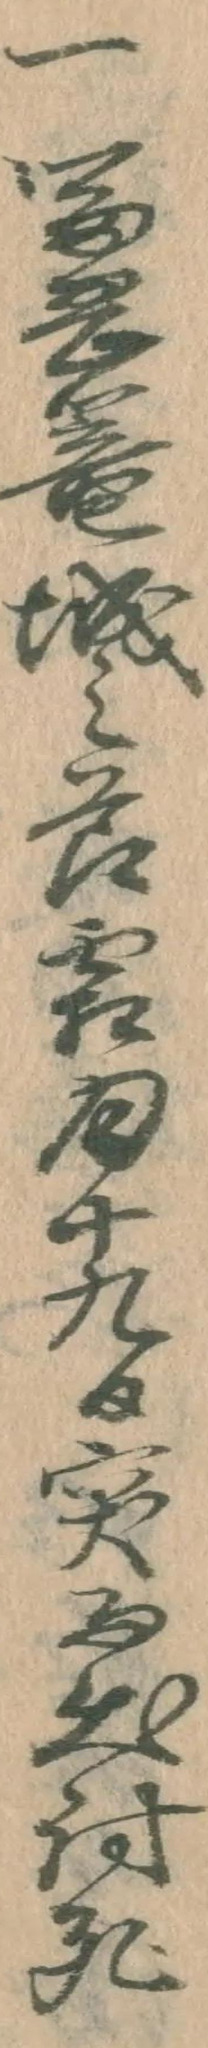一富岡篭城之節霜月十九日突而出討死
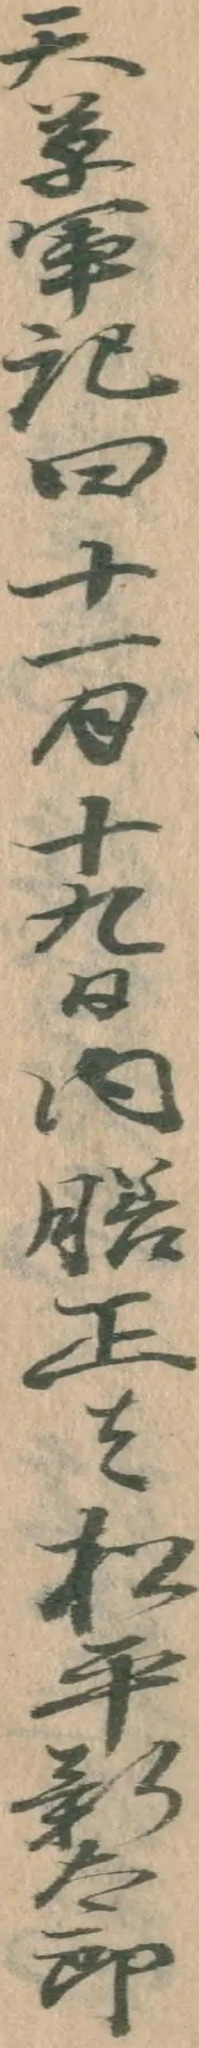天草軍記曰十一月十九日内膳正は松平新太郎
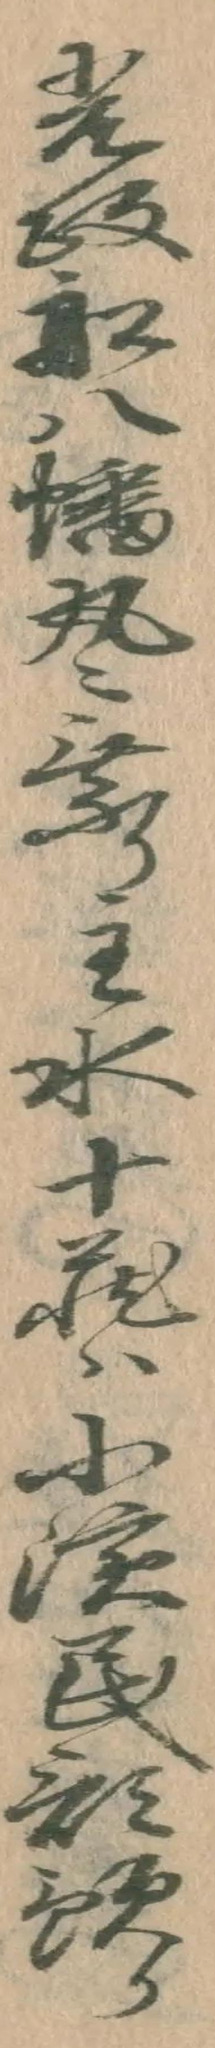光政船八幡丸に乗り主水十蔵は小浜民部預り
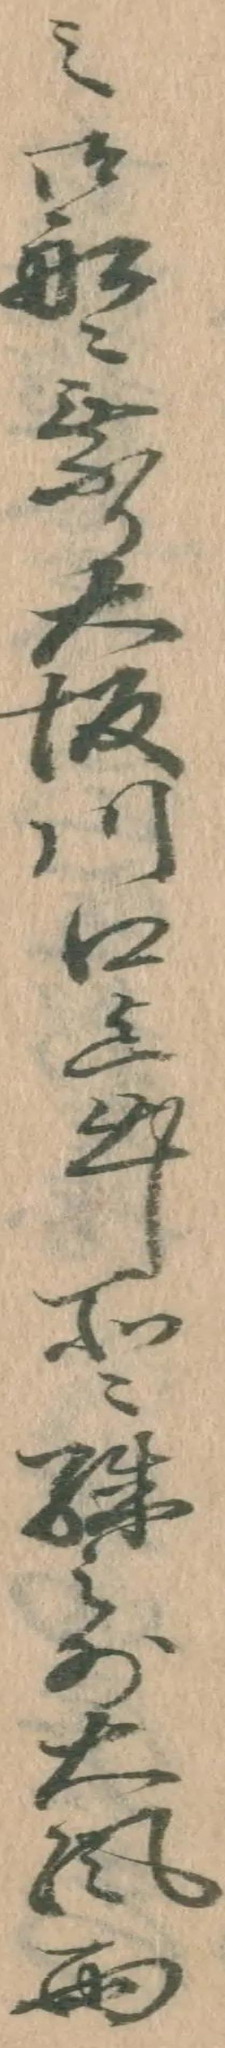之御船に乗り大坂川口迄出候所に殊之外大風雨
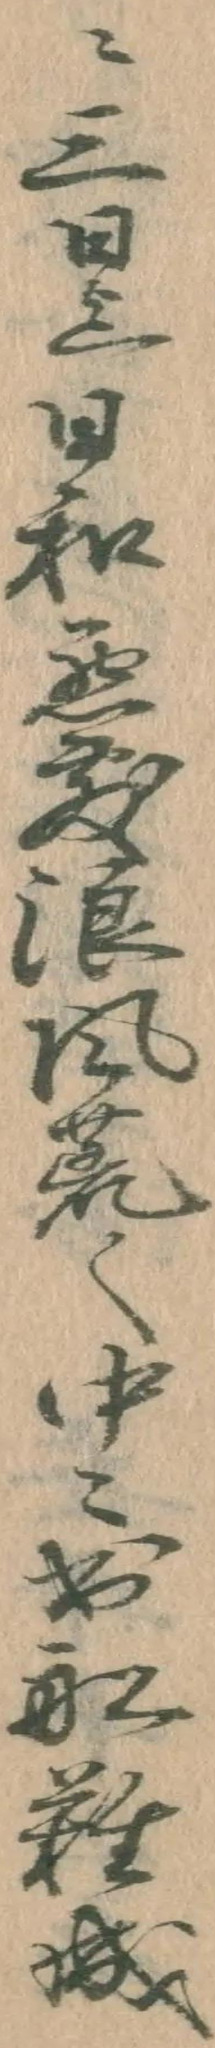に三日迄日和悪敷浪風荒て中々出船難成
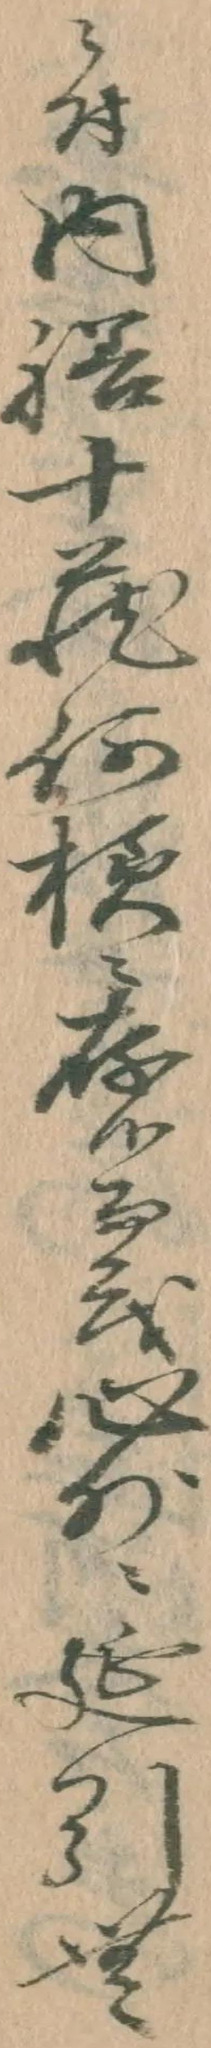に付内膳十蔵何様に存候而も心外に延引無
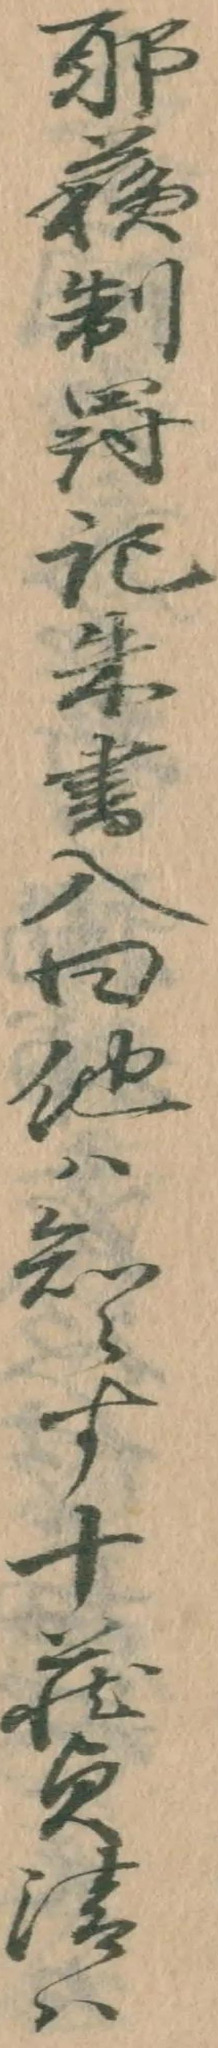耶蘇制罸記朱書入曰他は知らす十蔵貞清は
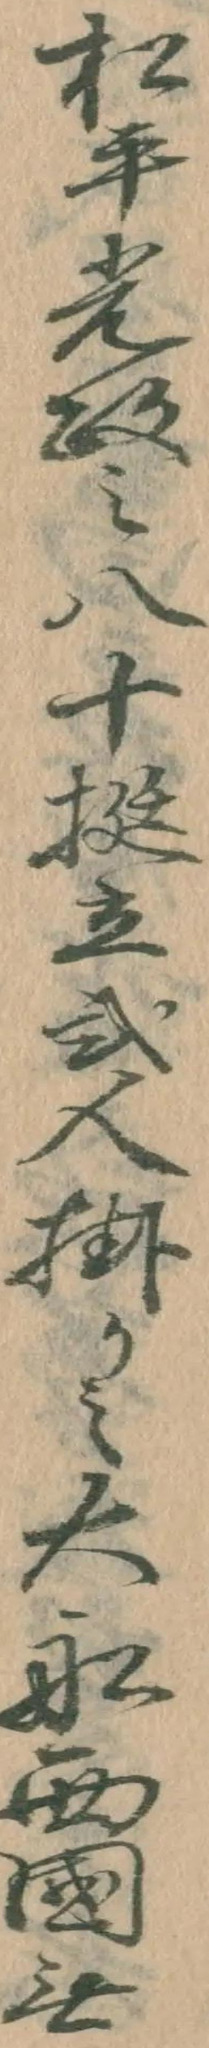松平光政之八十挺立弐人掛り之大船西国無
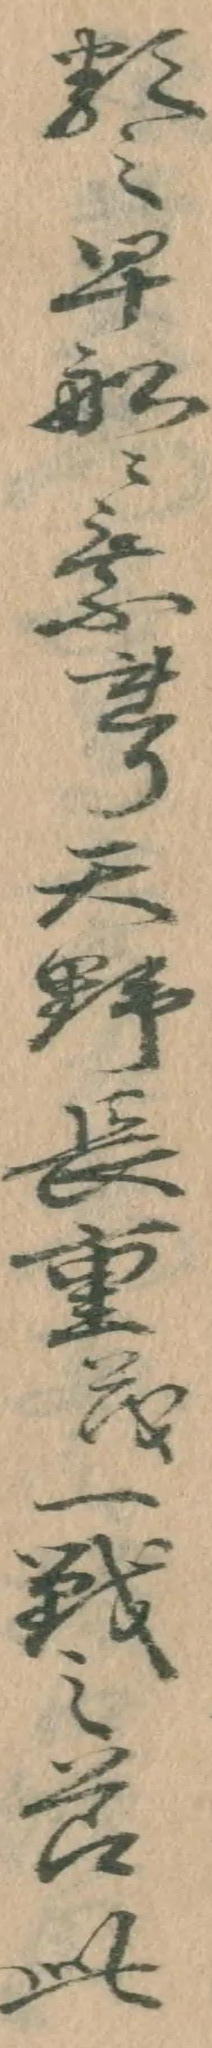類之早船に乗れり天野長重も一戦之節此
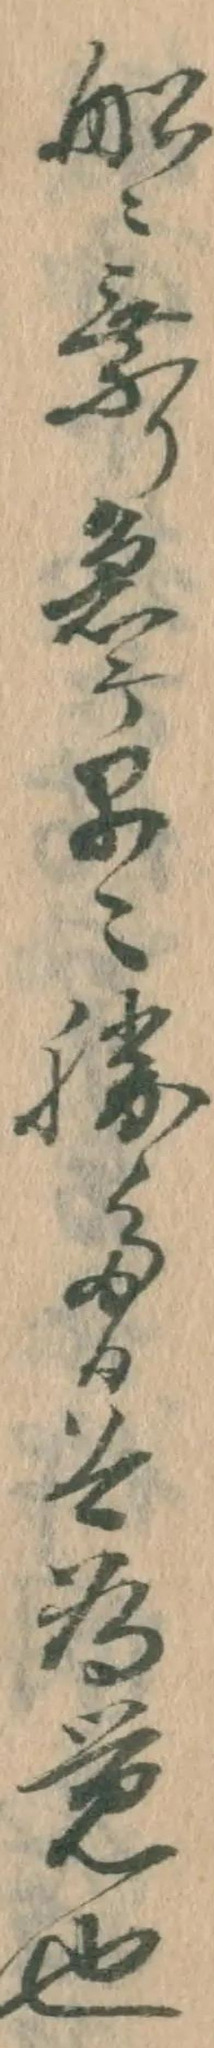船に乗り急テ早々勝たるそ為覚也
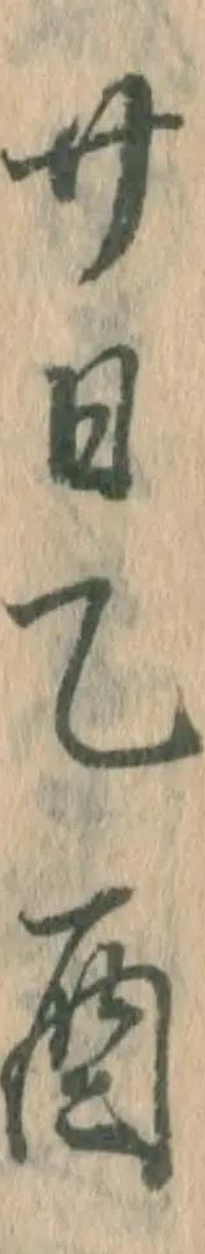廿日乙酉
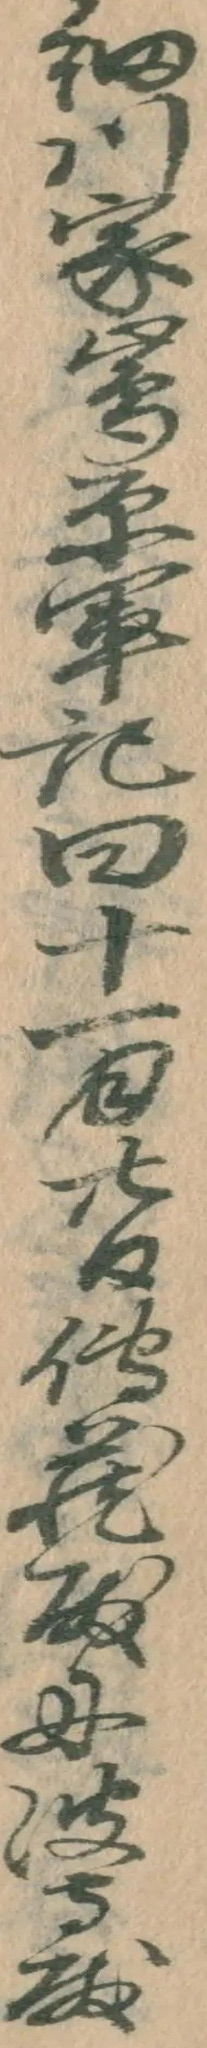細川家島原軍記曰十一月廿日伝蔵殿丹波守殿
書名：切支丹御退治記 49巻. [3]
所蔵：国立国会図書館 National Diet Library, JAPAN
